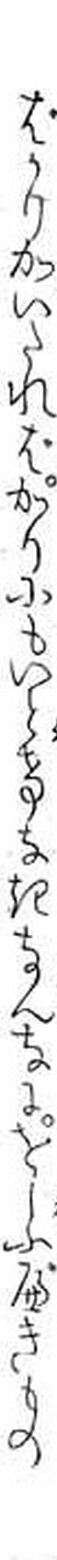ばかりかいたれば。かりにもいとけなきなんなに。をしふべきもの
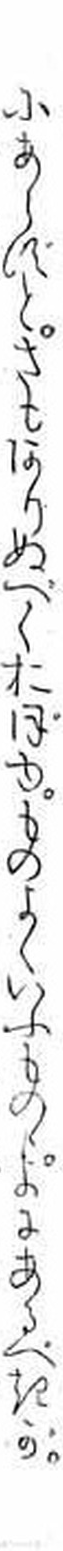にあらずと。さもありぬべくおぼゆ。ものよくいふものゝ。よにあるべきが。
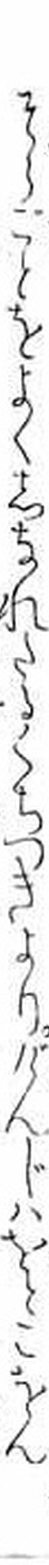そらごとをよくしなれたるくちつきより。げんじはおとこをん
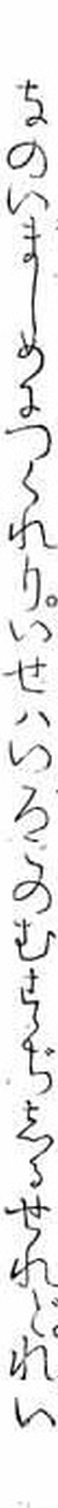なのいましめにつくれり。いせはいろごのむすぢしるせれど。れい
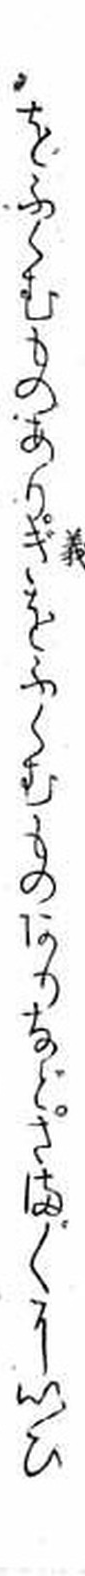をふくむものあり。ぎをふくむものありなど。さま〴〵にいひ

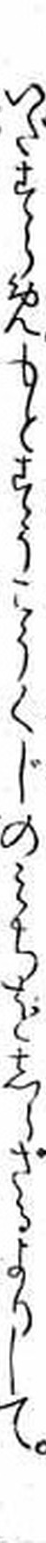いだすらめ。もとすうこうくじのみちをしらざるよりして。
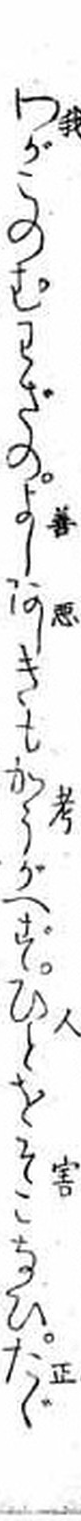わがこのむわざの。よしあしきもかうがへず。ひとをそこなひ。たゞ
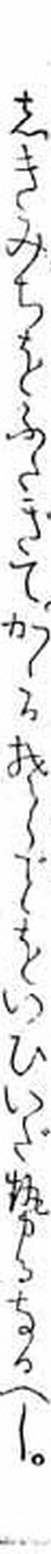しきみちをふたぎて。かヽるそらごとをいひいざせるなるへし。
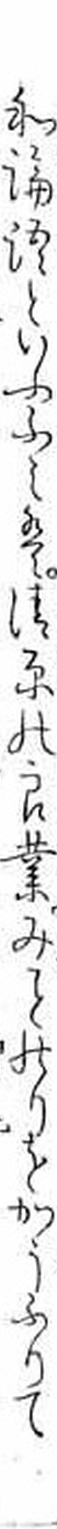和論語といふふみは。清原の良業。みことのりをかうふりて
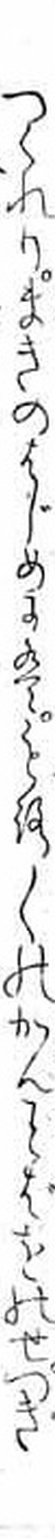つくれり。まきのはじめには。もろ〳〵のかんことばをのせ。つぎ
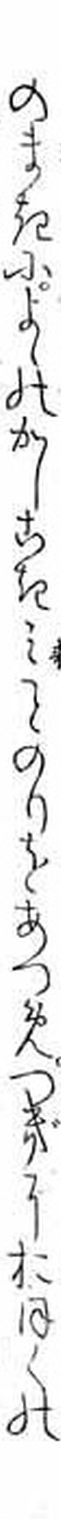のまきに。よゝのかしこきみことのりをあつめ。つぎにおほくの
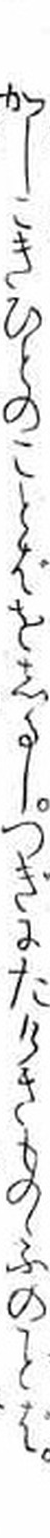かしこきひとのことばをしるし。つぎにたけきものゝふのことば。
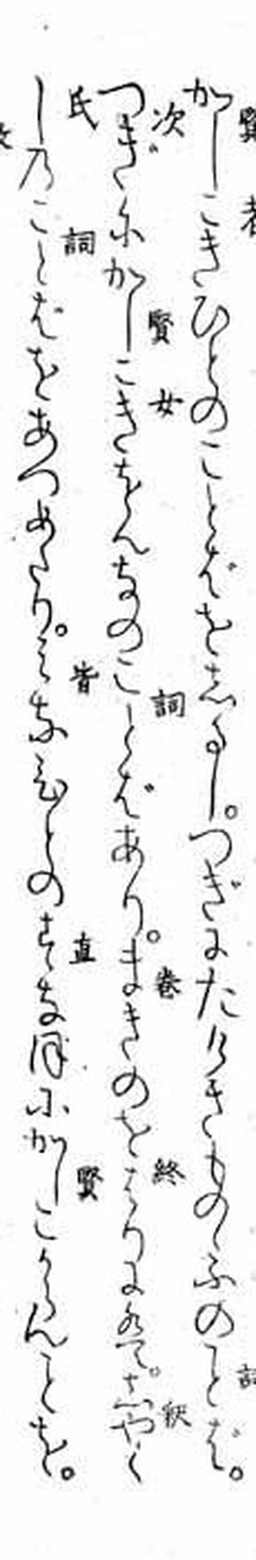つぎにかしこきおんなのことばあり。まきのをはりには。しやく
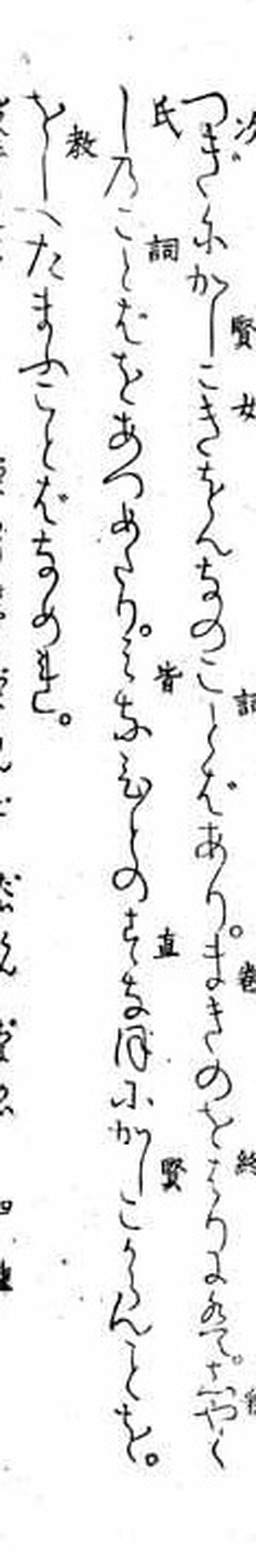しのことばをあつめたり。みなひとのすなほにかしこからんことを。
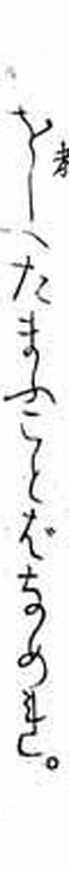をしへたまふことばなめれ。
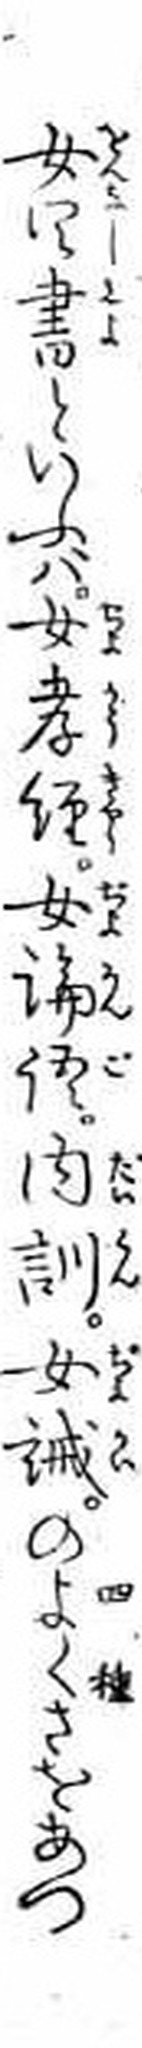女四書といふは。女考経。女論語。内訓。女誡。のよくさをあつ
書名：女学範
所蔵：東京学芸大学教育コンテンツアーカイブ
